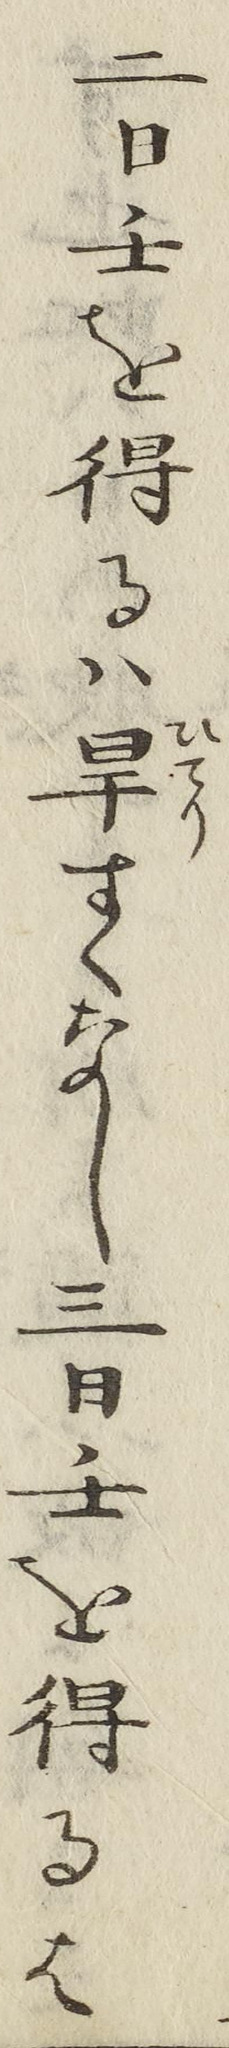二日壬を得るは旱すくなし三日壬を得るは
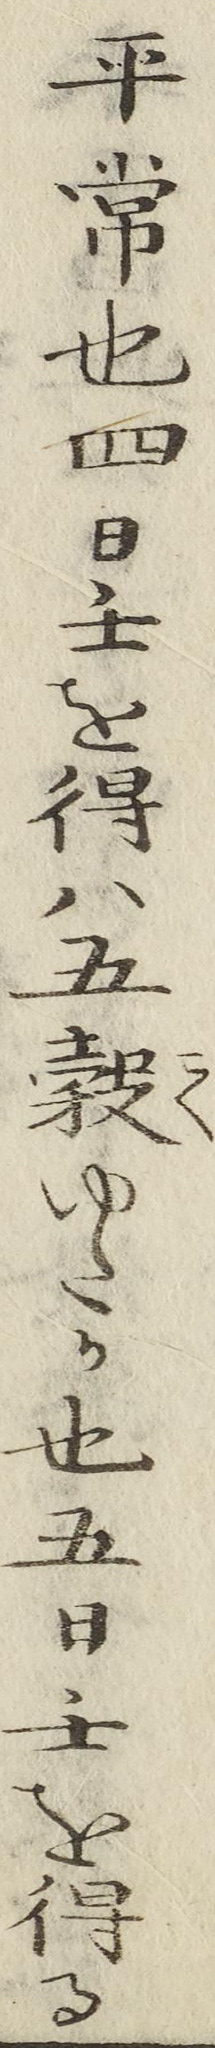平常也四日壬を得は五穀ゆたか也五日壬を得る
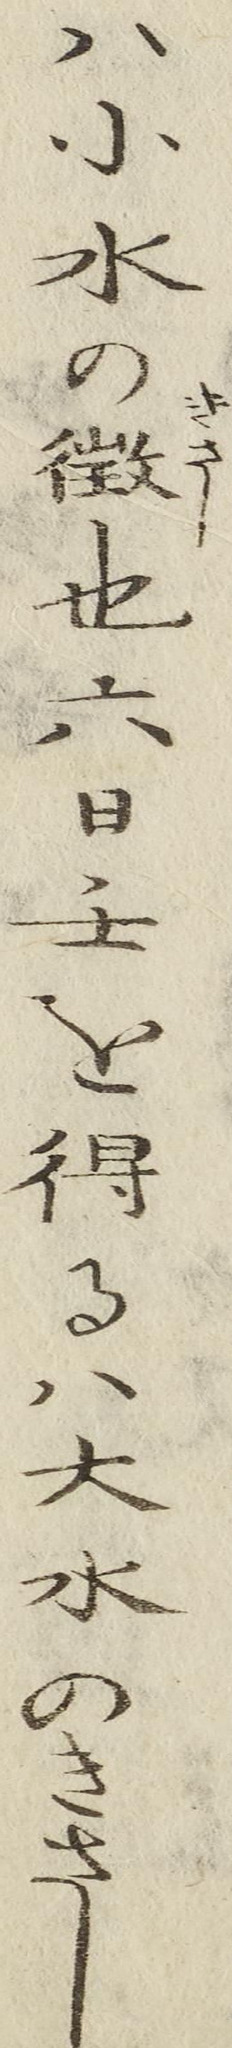は小水の徴也六日壬を得るは大水のきさし
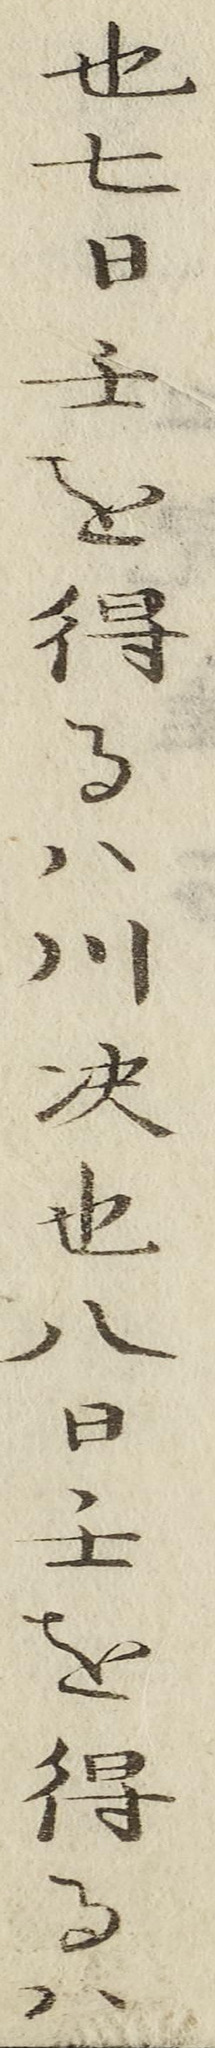也七日壬を得るは川決也八日壬を得るは
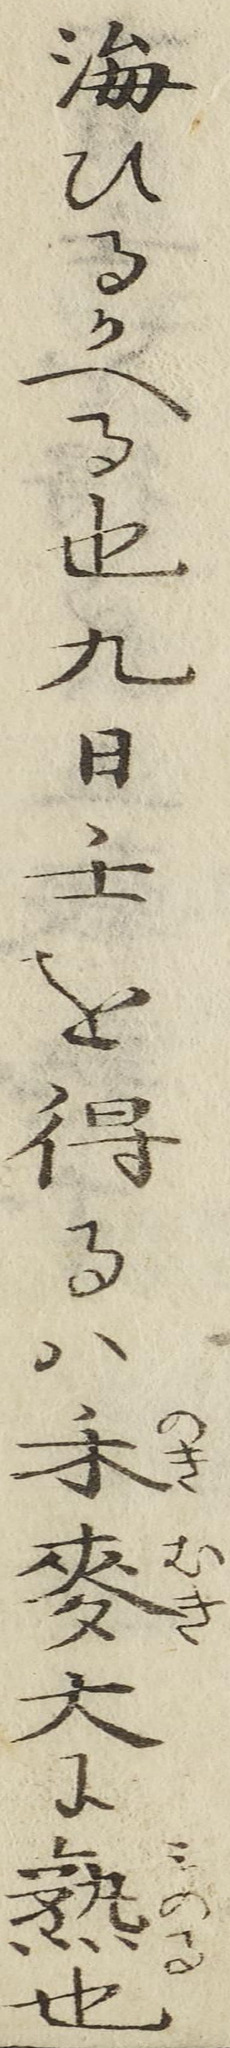海ひるかへる也九日壬を得るは禾麦大に熟也

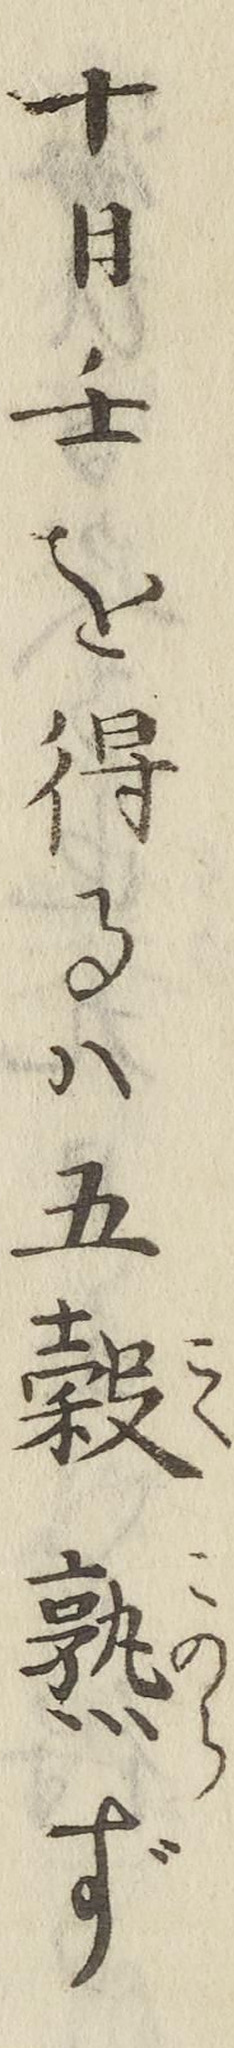十日壬を得るは五穀熟ず
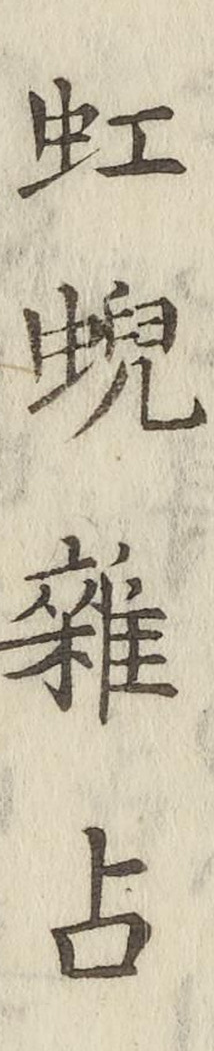虹蜺雑占
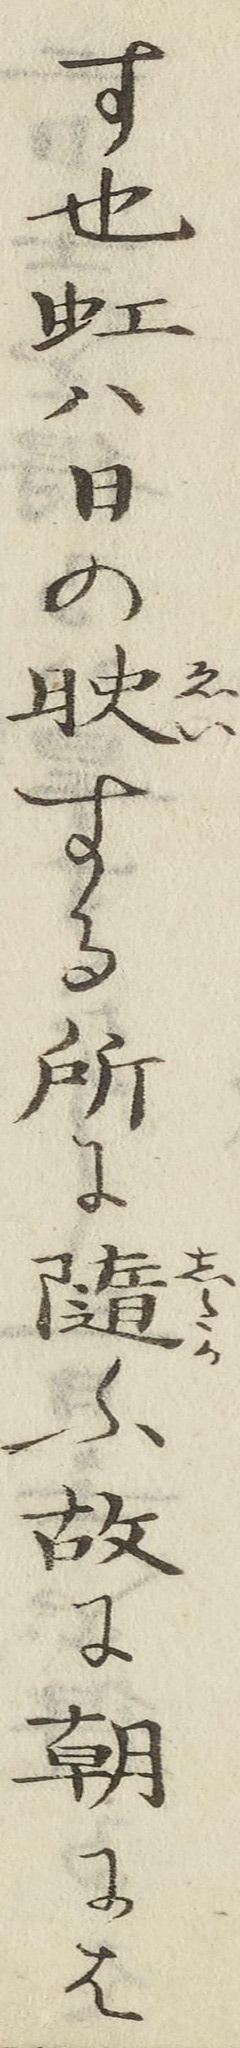す也虹は日の映する所に随ふ故朝には
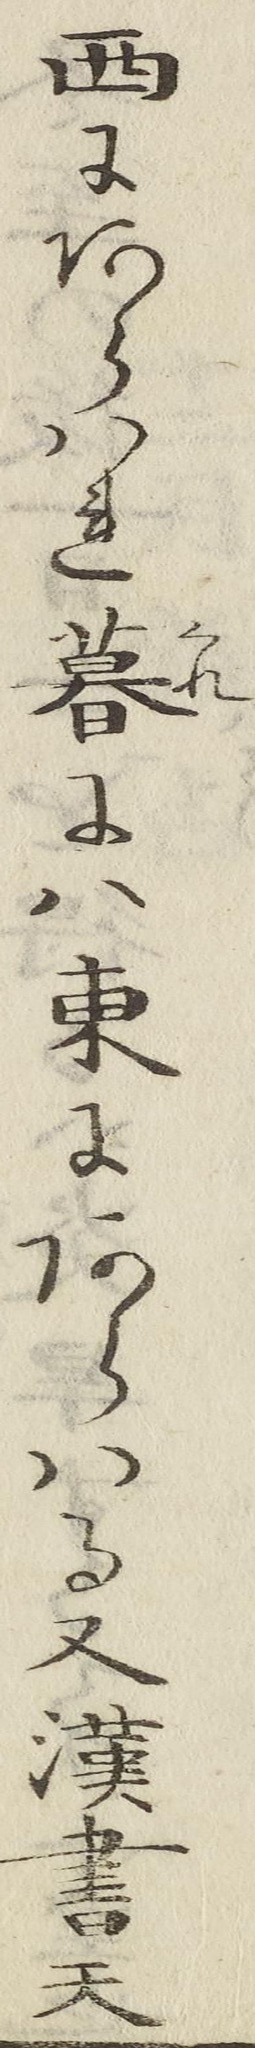西にあらはれ暮には東にあらはる又漢書天
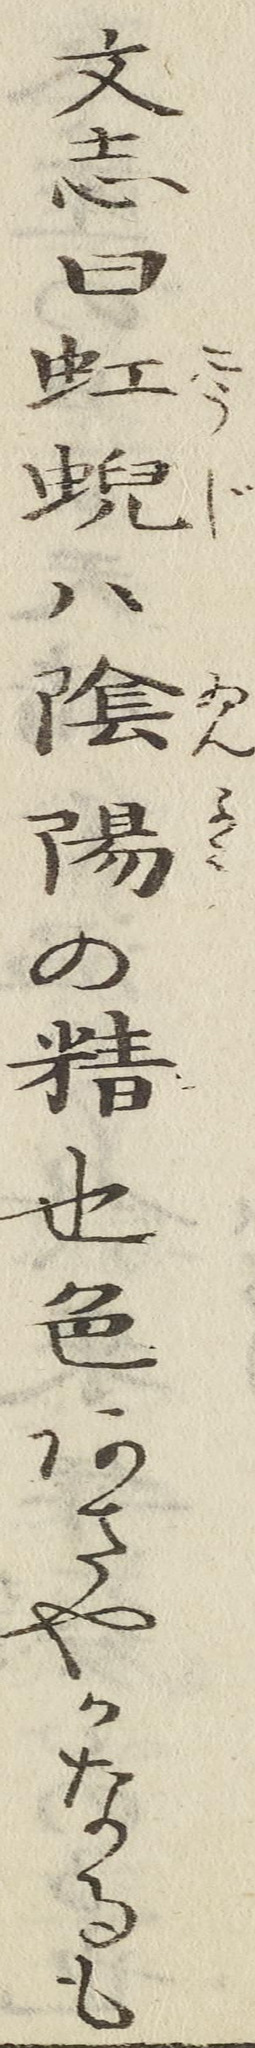文志曰虹蜺は陰陽の精也色あさやかなるも
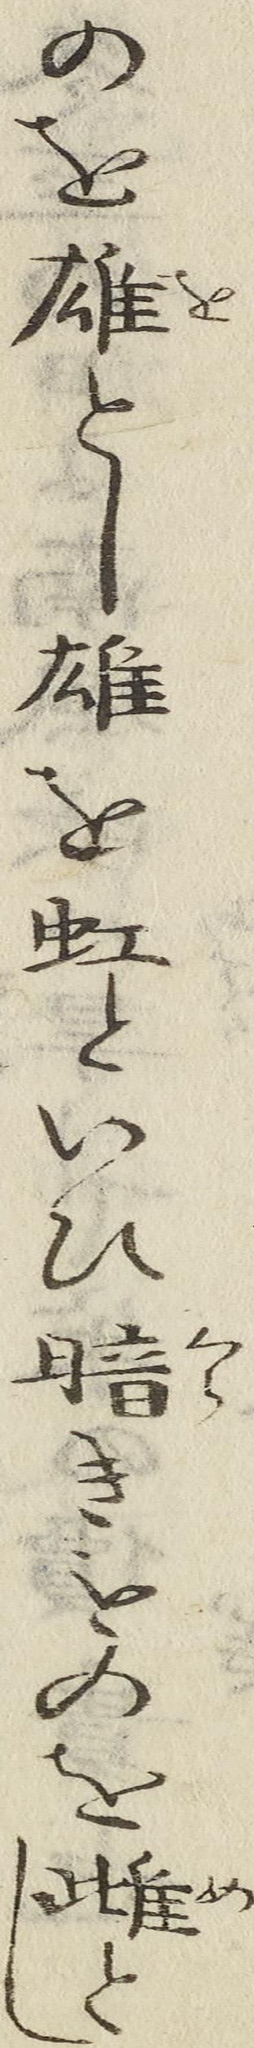のを雄とし雄を虹といひ暗きものを雌とし
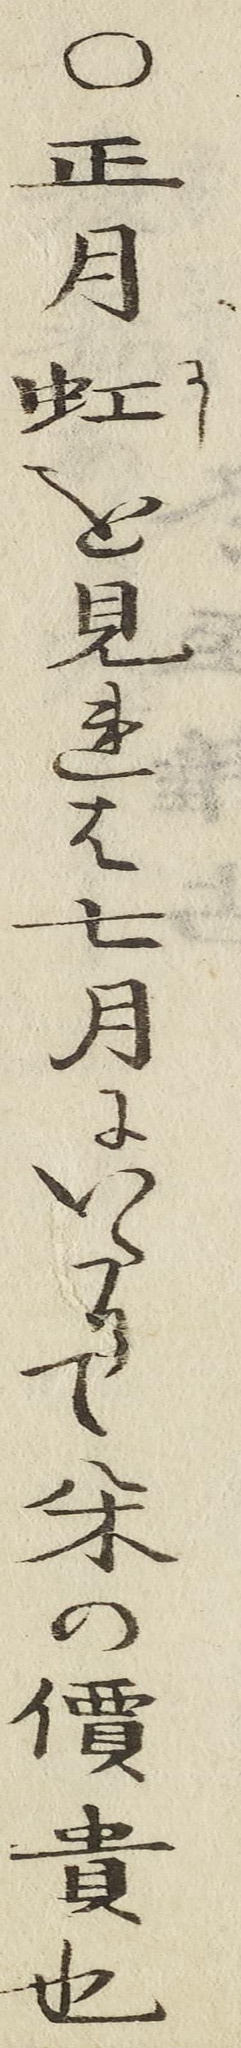○正月虹を見れは七月にいたりて米の価貴也
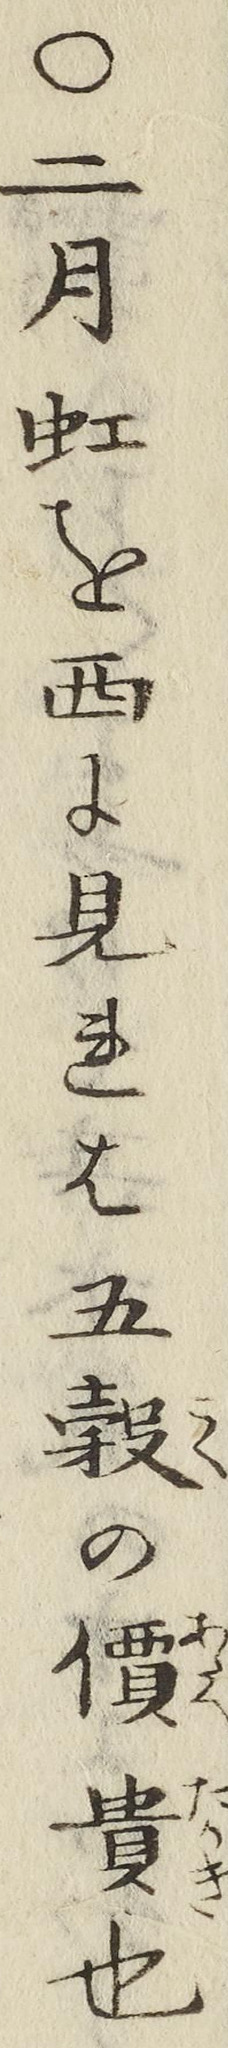○二月虹を西に見れは五穀の価貴也
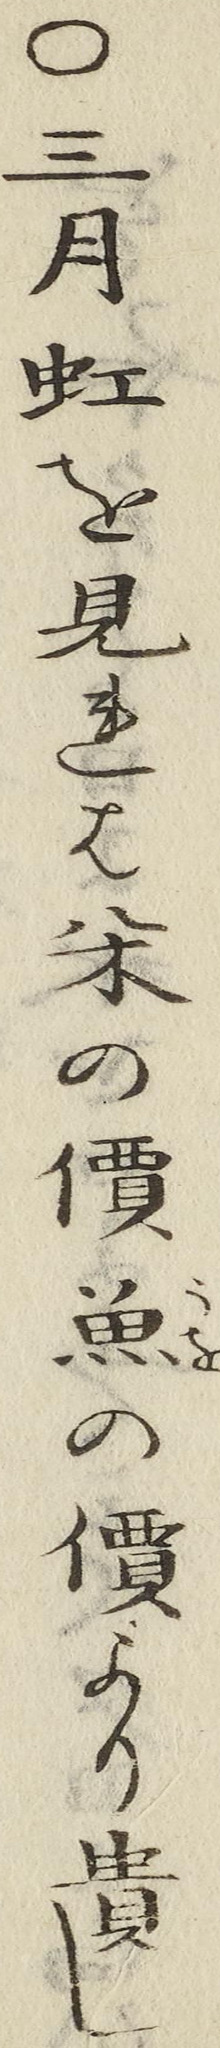○三月虹を見れは米の値魚の価より貴し
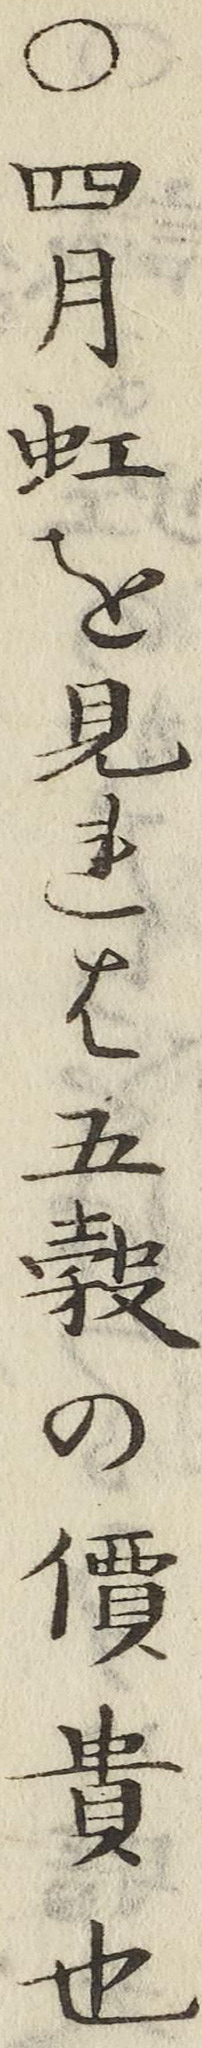○四月虹を見れは五穀の価貴也
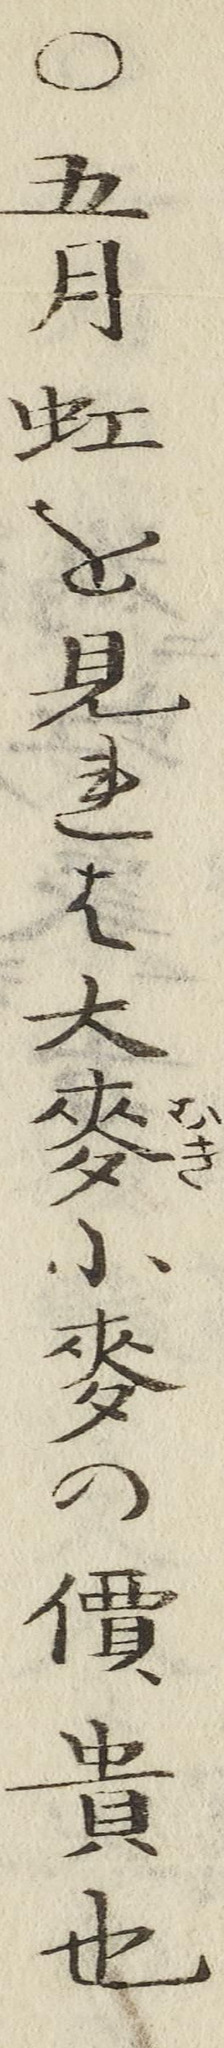○五月虹を見れは大麦小麦の価貴也
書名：天時占候　二
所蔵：東京大学地震研究所図書室 Earthquake Research Institute Library, The University of Tokyo, JAPAN
